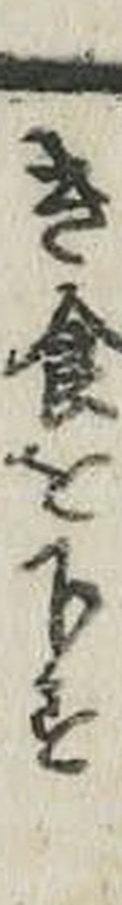き食を下す
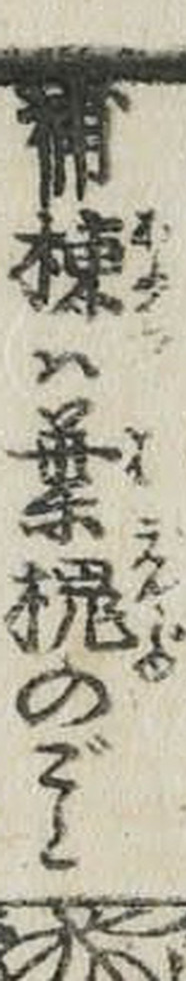補楝は葉槐のごと
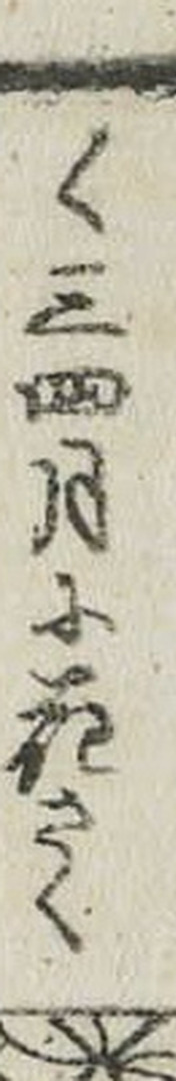く三四月に花さく
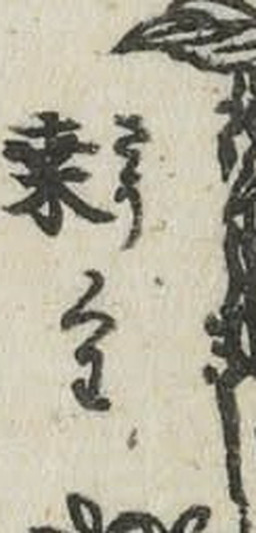桑くわ
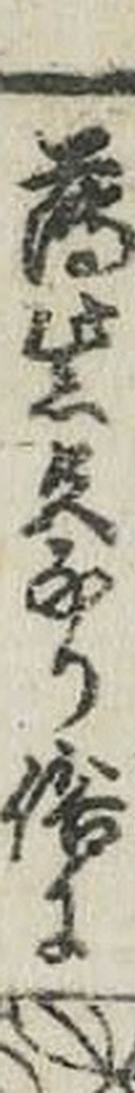薄紫色なり俗に
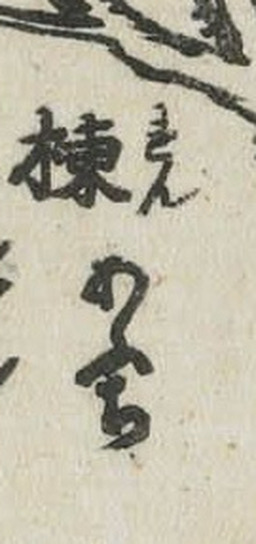楝あふち
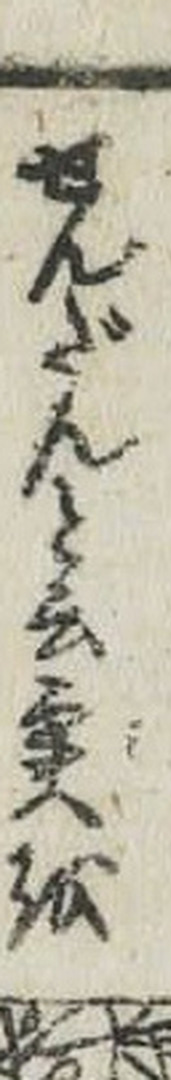せんだんと云実を
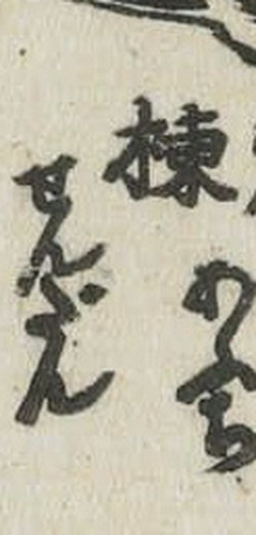せんだん
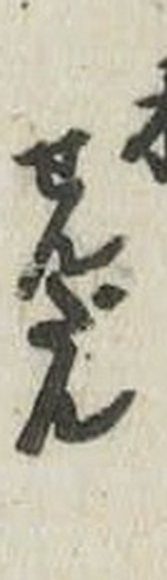せんだん
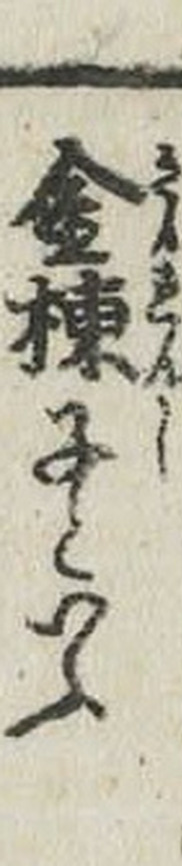金棟子といふ
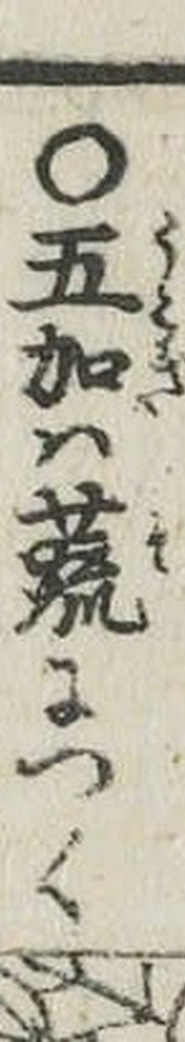○五加は蔬につく
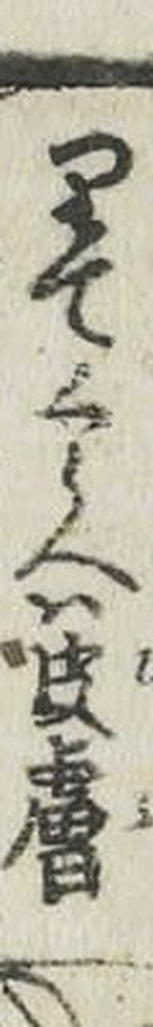りてくらへは皮膚
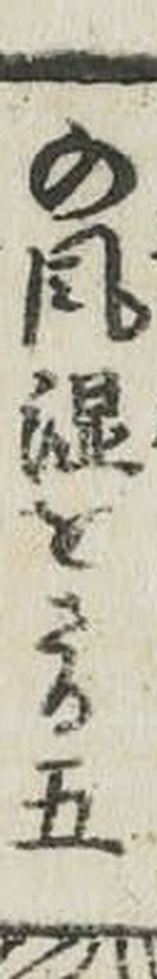の風湿をさる五
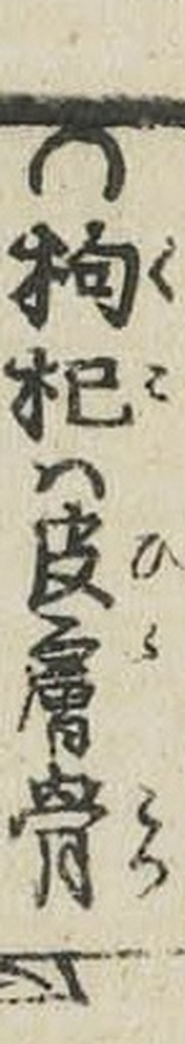○枸杞は皮膚骨
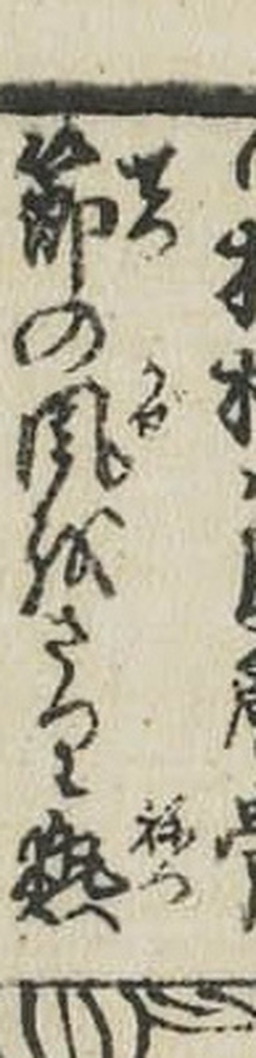節の風をさり熱
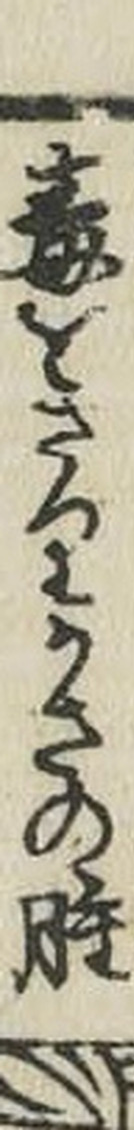毒をさりかさの腫
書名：増補頭書訓蒙図彙大成 10巻 8:巻之17-19
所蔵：東京学芸大学教育コンテンツアーカイブ
